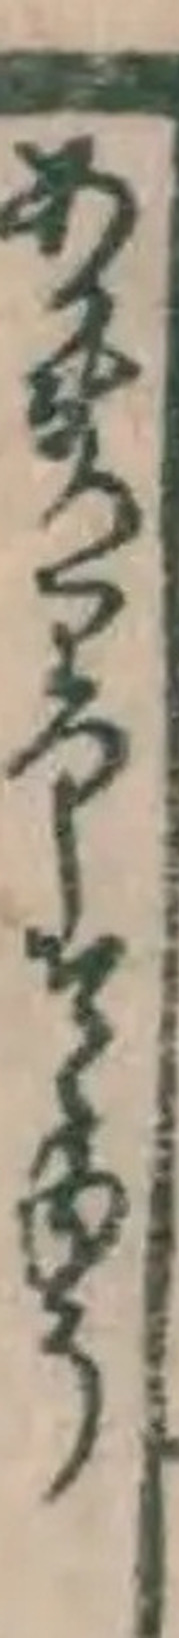あかまつりつしそたゆう
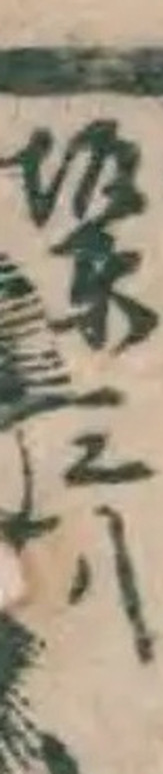坂東三八
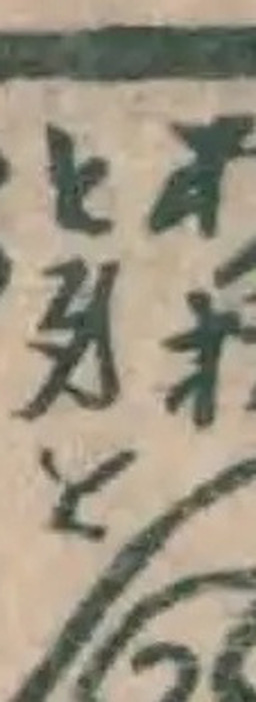と身を
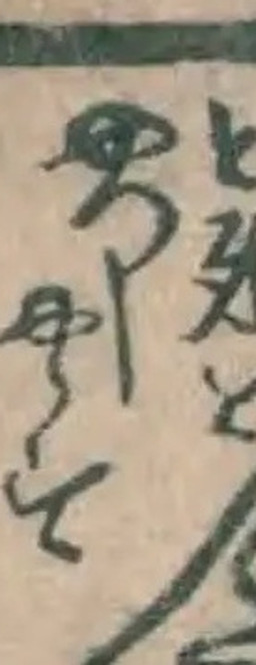やうす
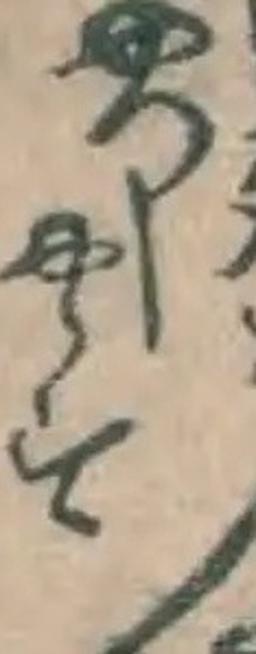やうす
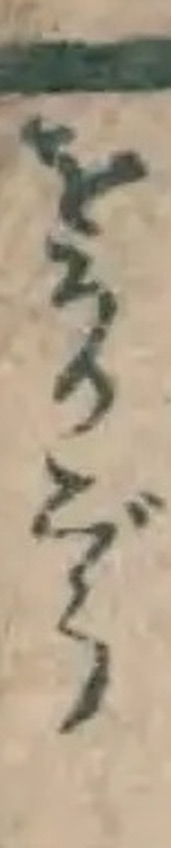をうかごう
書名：親船太平記
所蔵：国立国会図書館 National Diet Library, JAPAN
